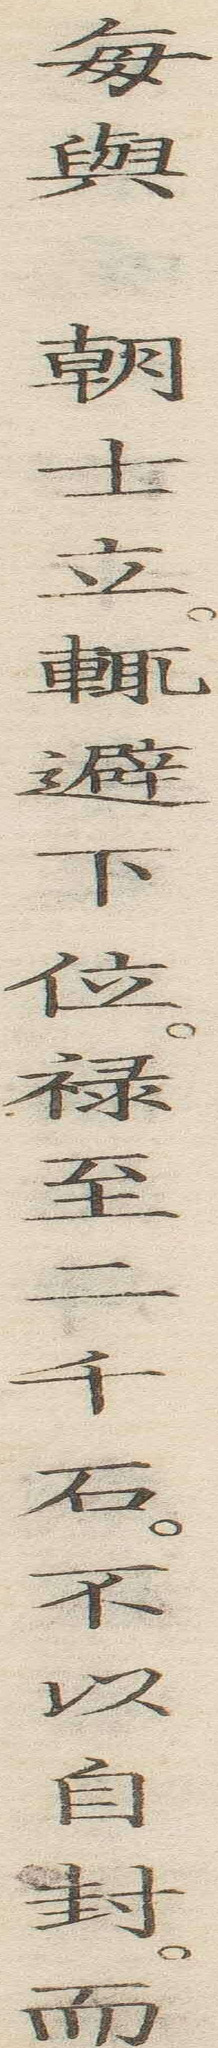每與朝士立。輒避下位。禄至二千石。不以自封。而
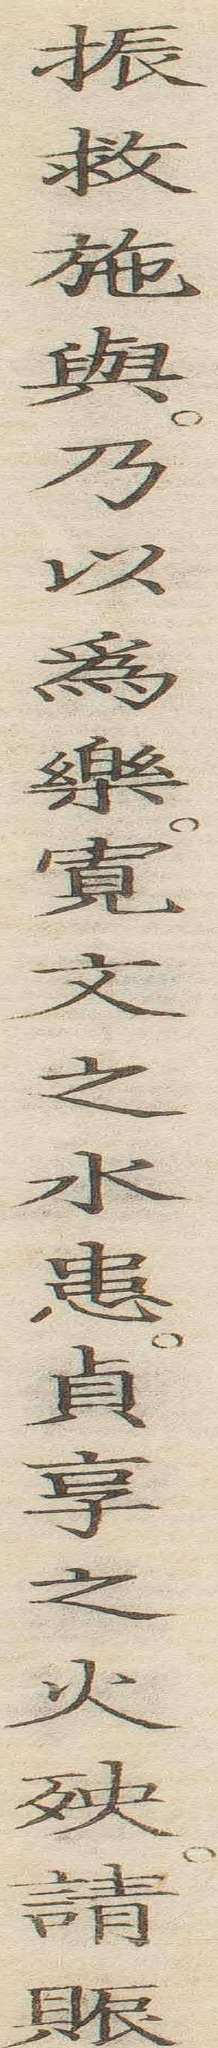振救施與。乃以爲樂。寛文之水患。貞享之火殃。請賑
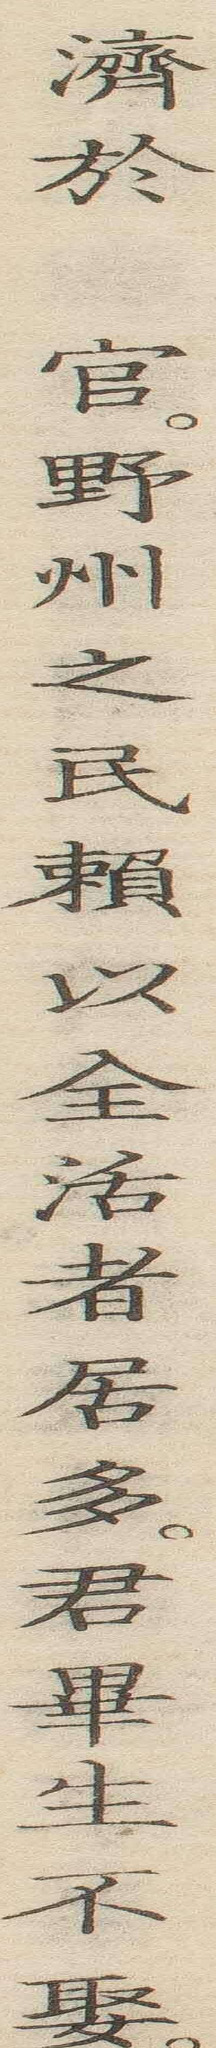濟於官。野州之民賴以全活者居多。君畢生不娶。

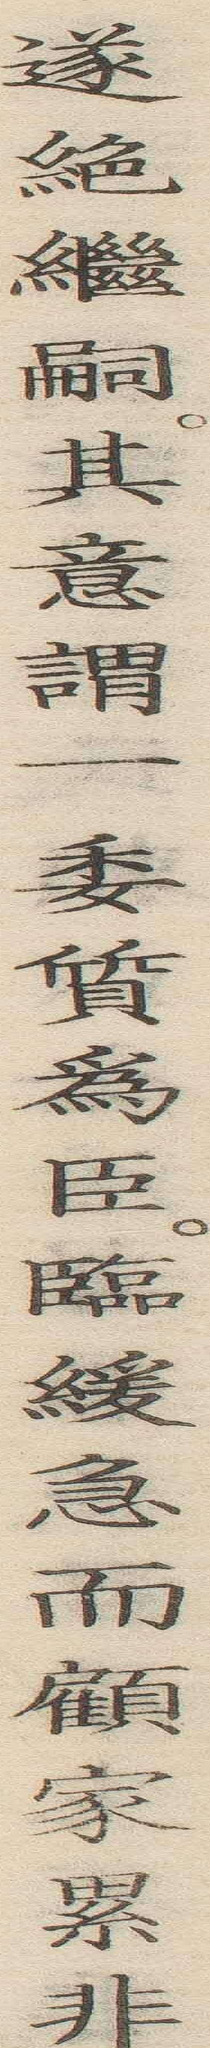遂絶繼嗣。其意謂一委質爲臣。臨緩急而顧家累非
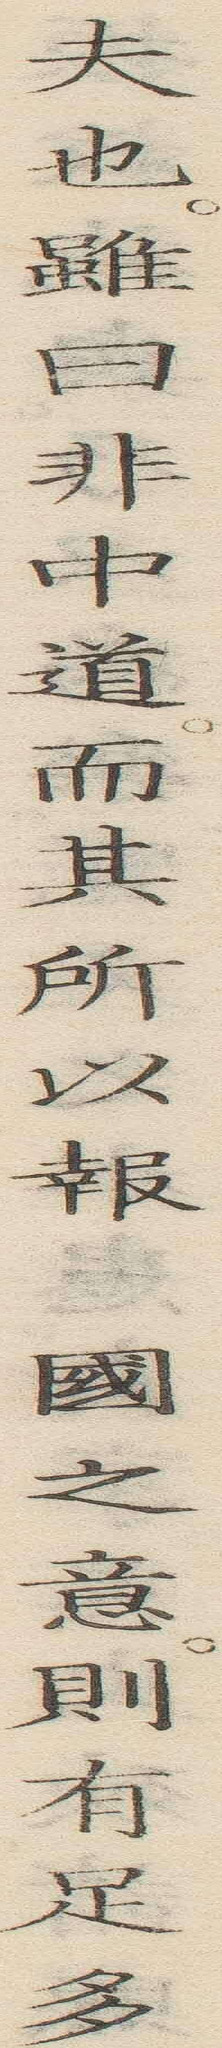夫也。雖曰非中道。而其所以報國之意。則有足多
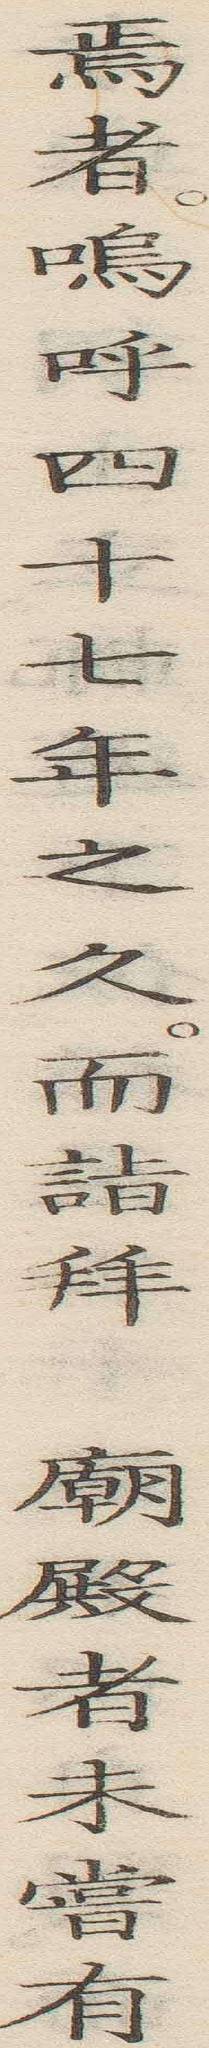焉者。嗚呼四十七年之久。而詣拜廟殿者未嘗有
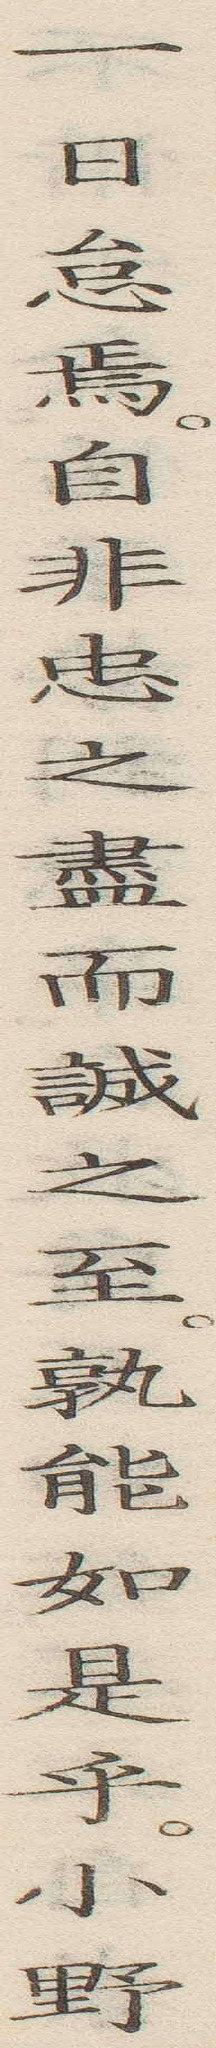一日怠焉。自非忠之盡而誠之至。孰能如是乎。小野
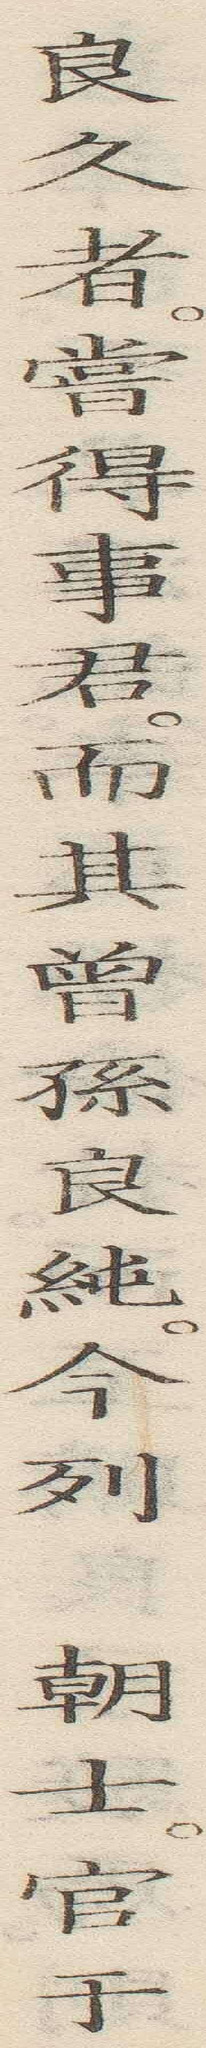良久者。嘗得事君。而其曾孫良純。今列朝士。官于
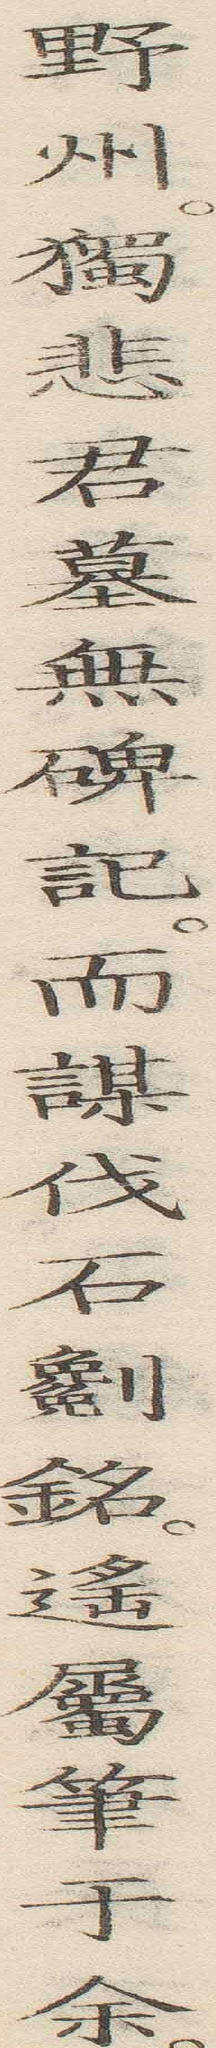野州。獨悲君墓無碑記。而謀伐石劖銘。遙屬筆于余。
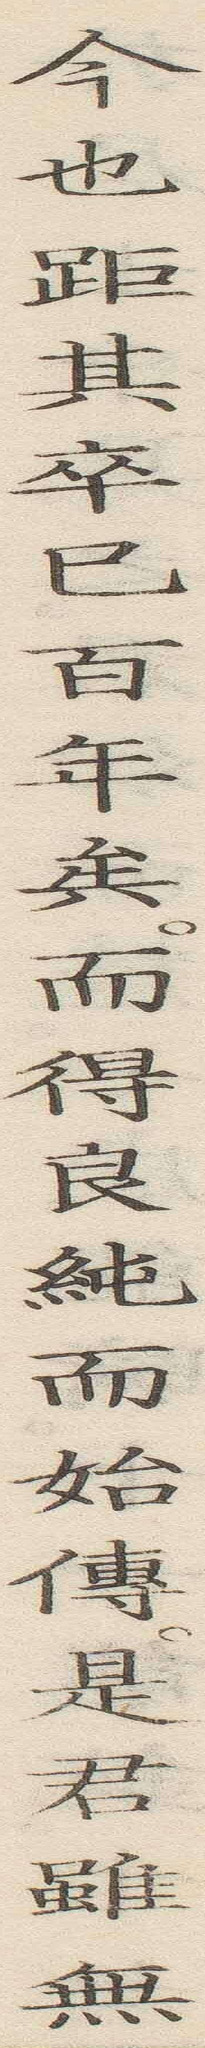今也距其卒巳百年矣。而得良純而始傳。是君雖無
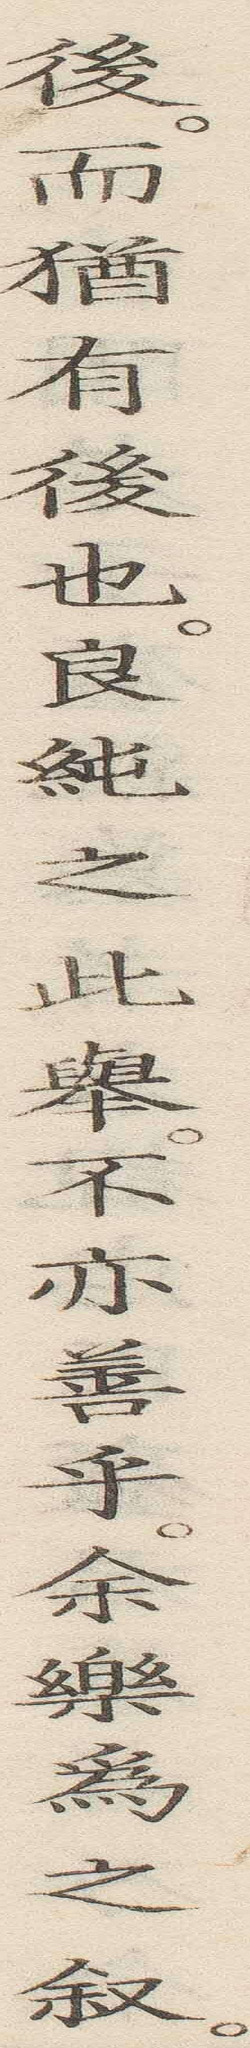後。而猶有後也。良純之此舉。不亦善乎。余樂爲之叙。
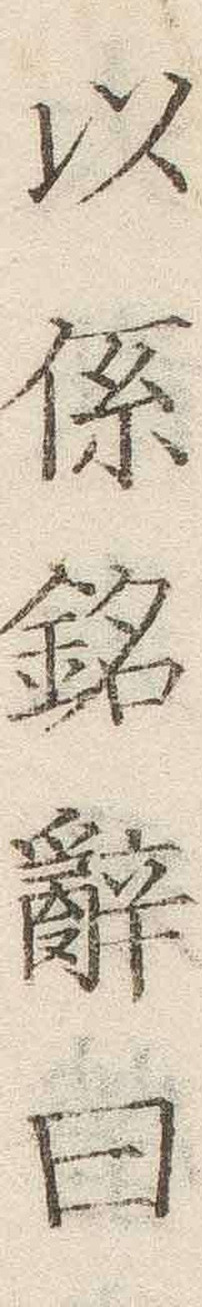以係銘辭曰
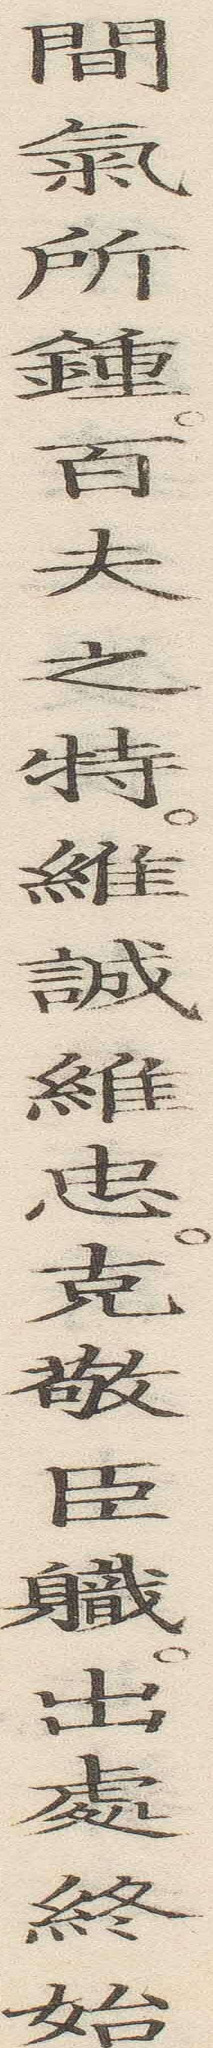間氣所鍾。百夫之特。維誠維忠。克敬臣軄。出處終始
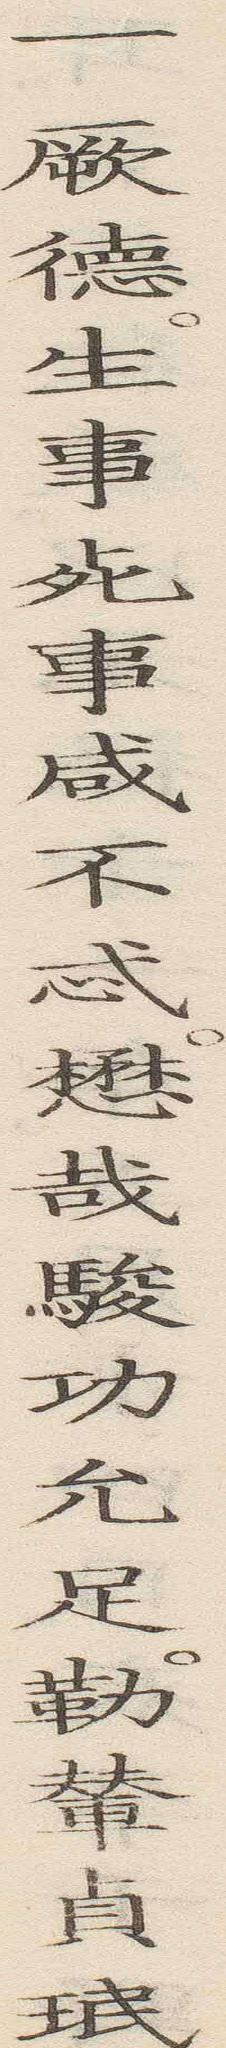一厥德。生事死事咸不忒。懋哉駿功允足。勒輦貞珉
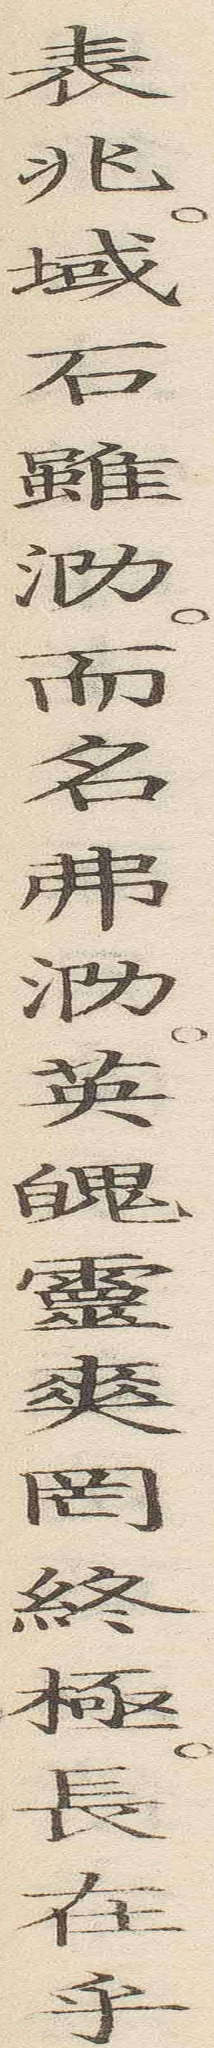表兆。域石雖泐。而名弗泐。英魄靈爽罔終極。長在乎
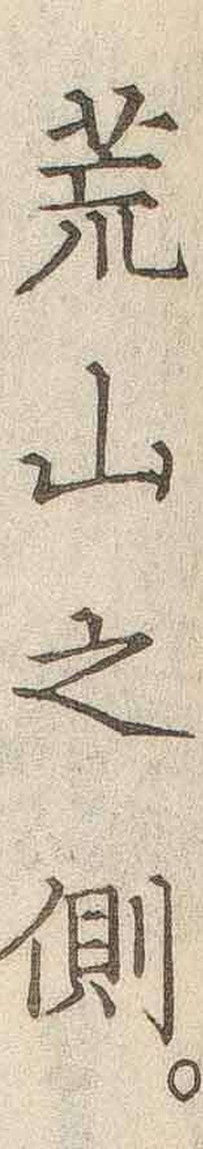荒山之側。
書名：日光山志
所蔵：東京学芸大学附属図書館 国文学研究資料館
